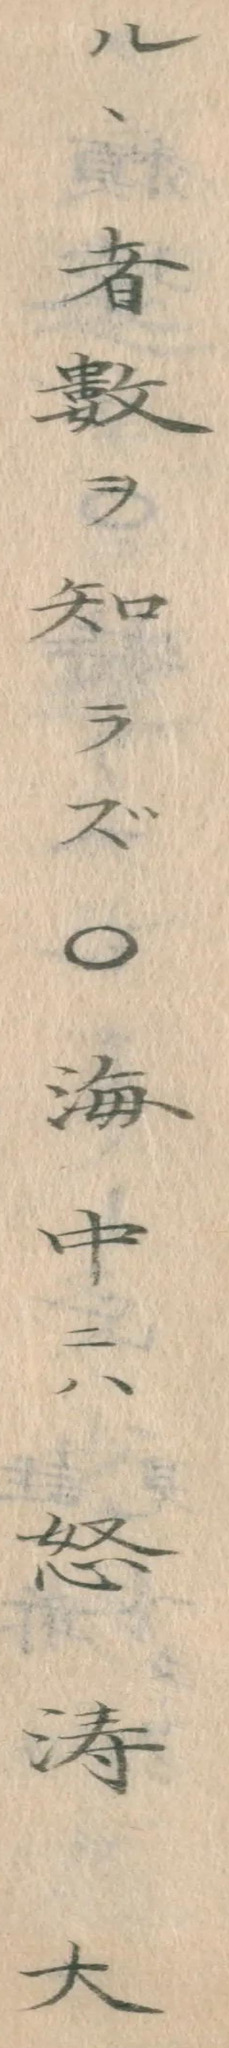ルヽ者数ヲ知ラズ○海中ニハ怒涛大
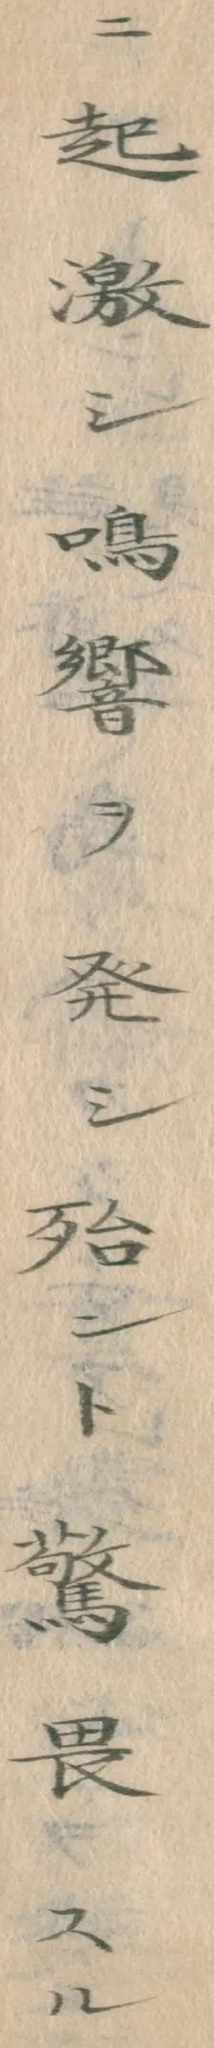ニ起激シ鳴響ヲ発シ殆ント驚畏スル
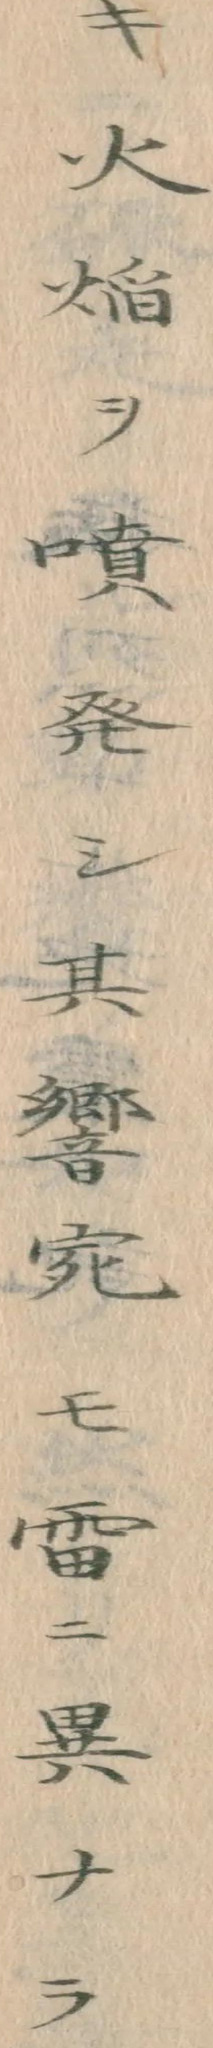キ火焔ヲ噴発シ其響モ雷ニ異ナラ
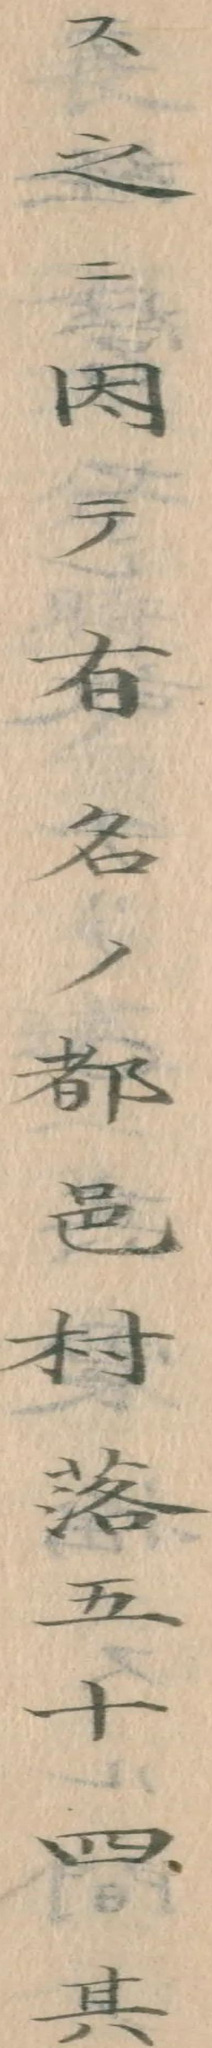ス之ニ因テ有名ノ都邑村落五十四其
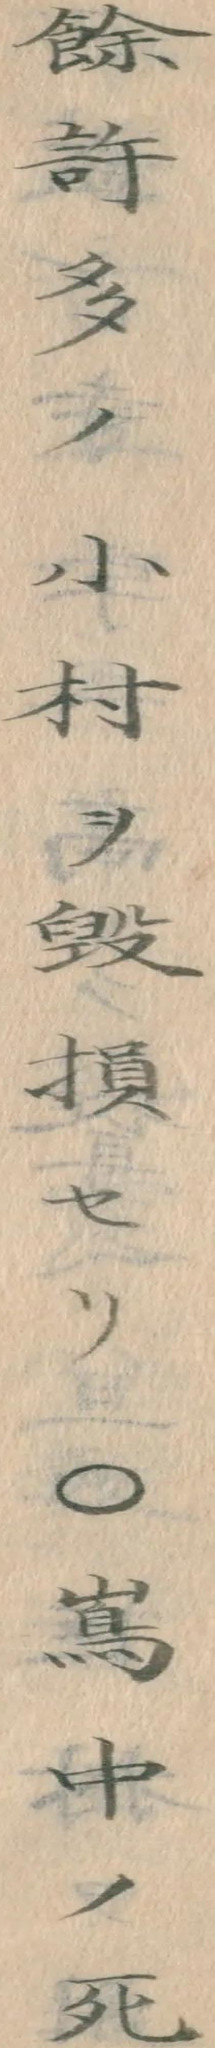余許多ノ小村ヲ毀損セリ○嶌中ノ死
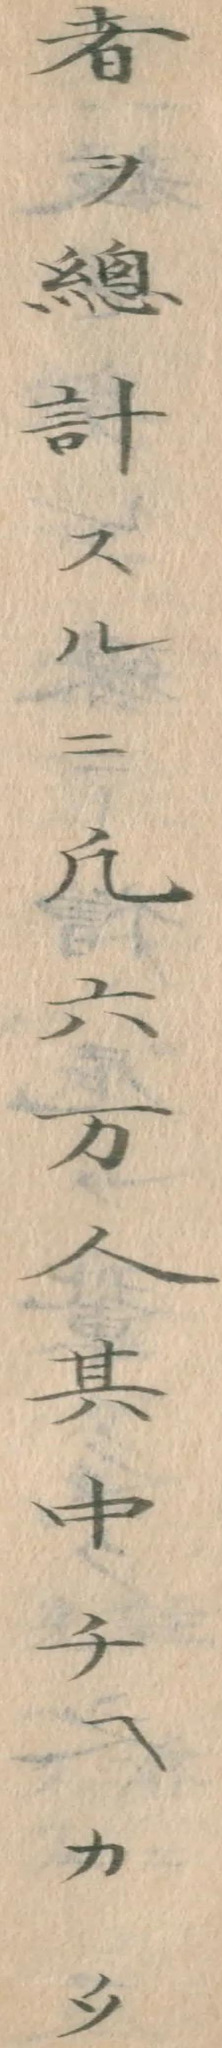者ヲ総計スルニ凡六万人其中チ「カタ
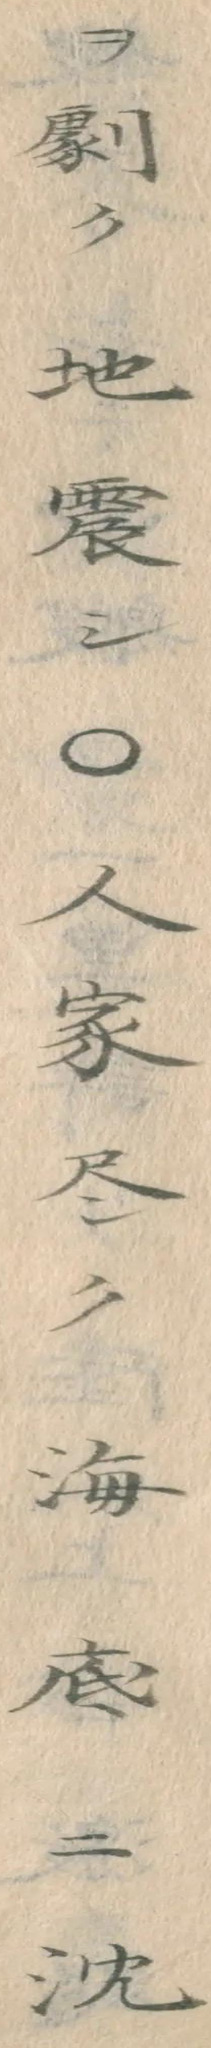ヲ劇ク地震シ○人家尽ク海底ニ沈
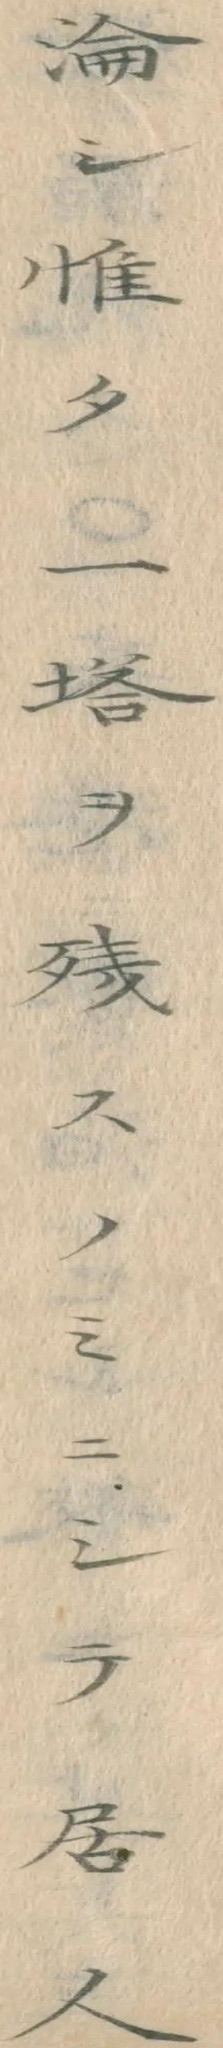淪シ惟タ一塔ヲ残スノミニシテ居人

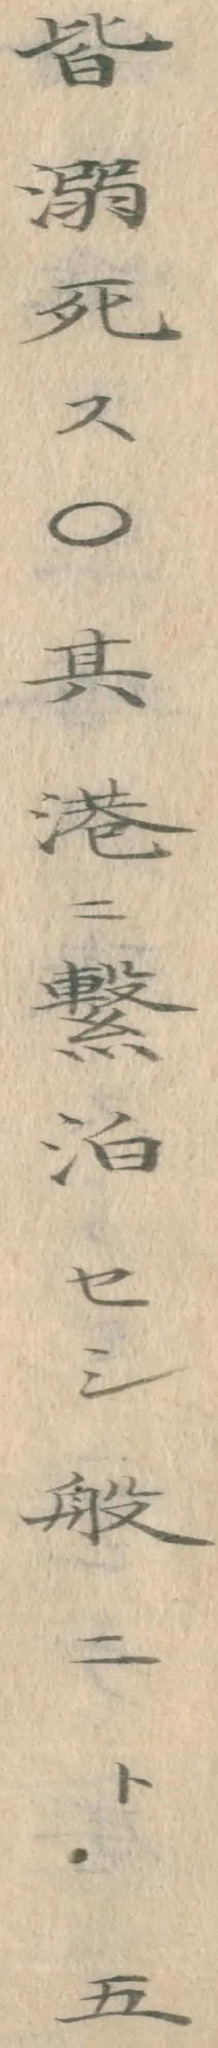皆溺死ス○其港ニ繋泊セシ般ニト五
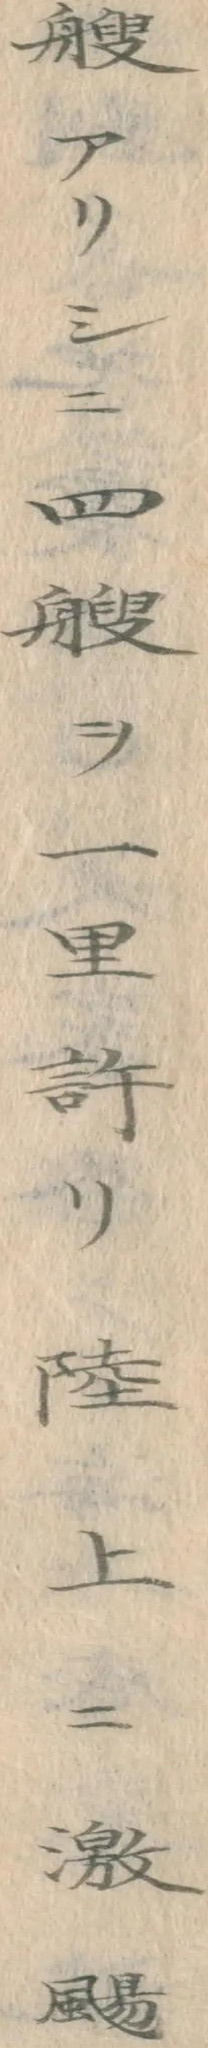艘アリシニ四艘ヲ一里許リ陸上ニ激颺
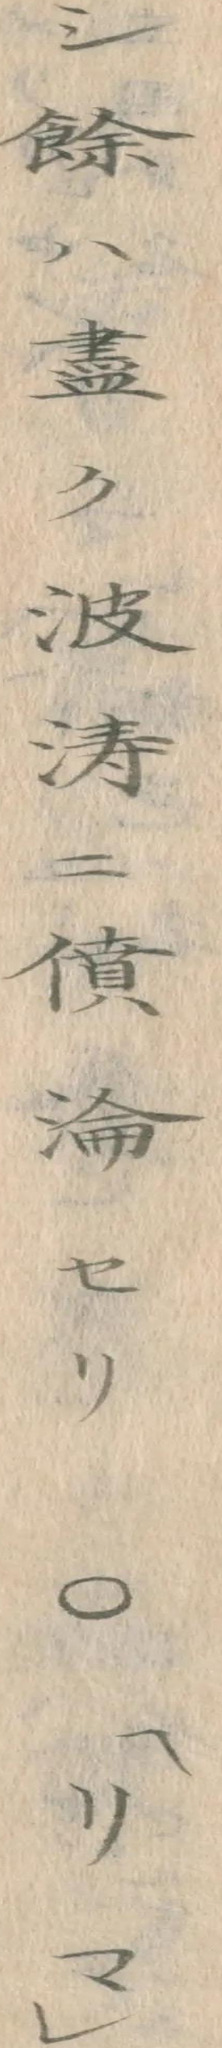シ余ハ尽ク波涛ニ僨淪セリ○「リマ」
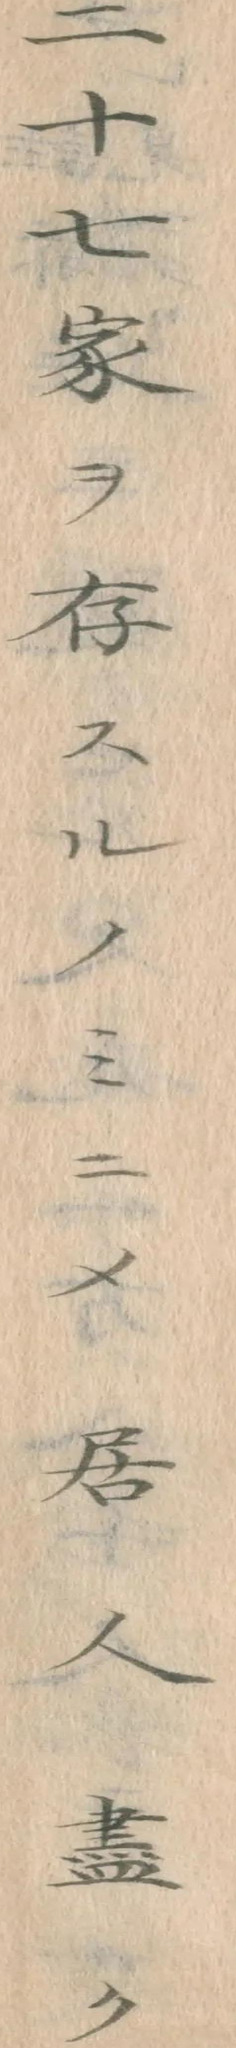二十七家ヲ存スルノミニメ居人尽ク
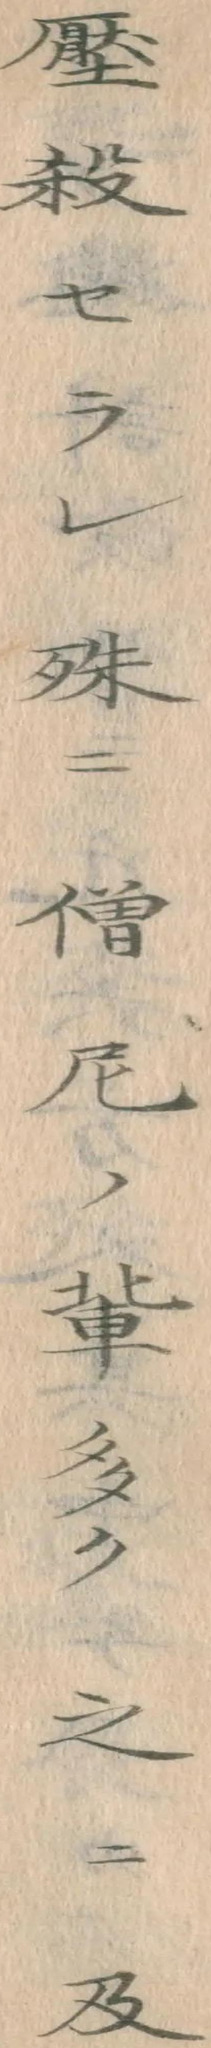圧殺セラレ殊ニ僧尼ノ輩多ク之ニ及
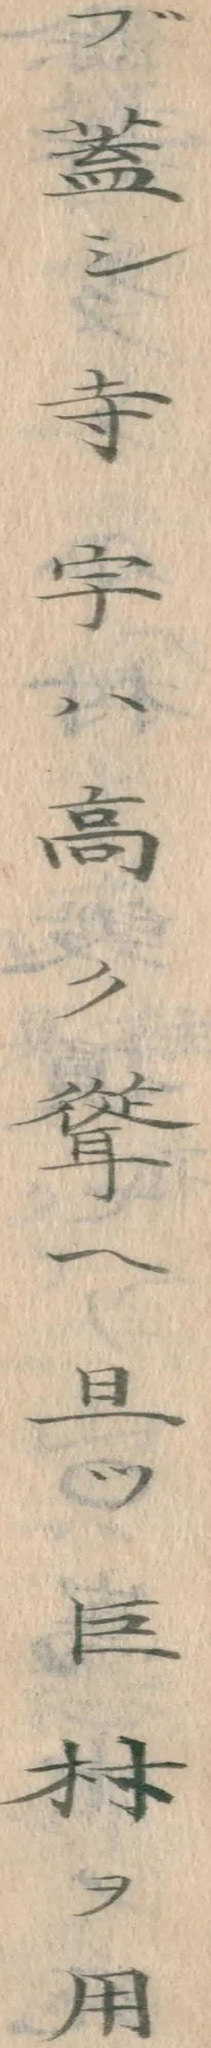ブ蓋シ寺宇ハ高ク聳ヘ且ツ巨ヲ用
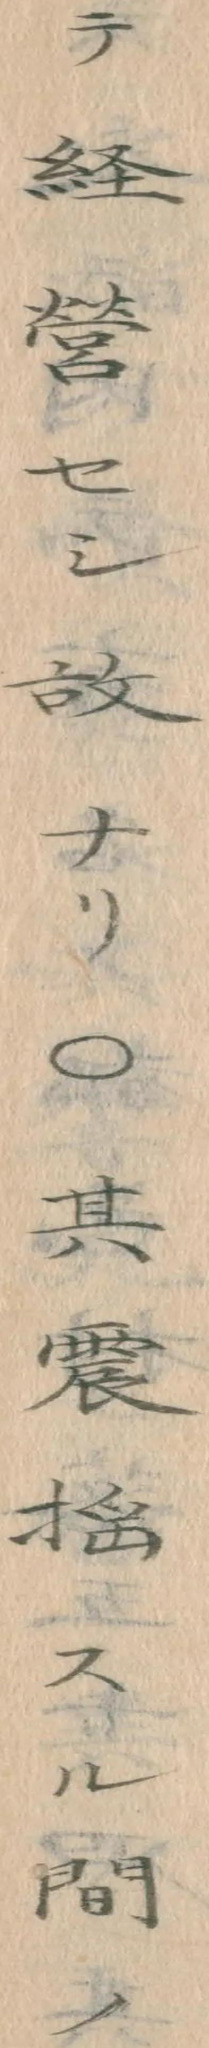テ経営セシ故ナリ○其震揺スル間ノ
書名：輪池叢書. 12
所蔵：国立国会図書館 National Diet Library, JAPAN
